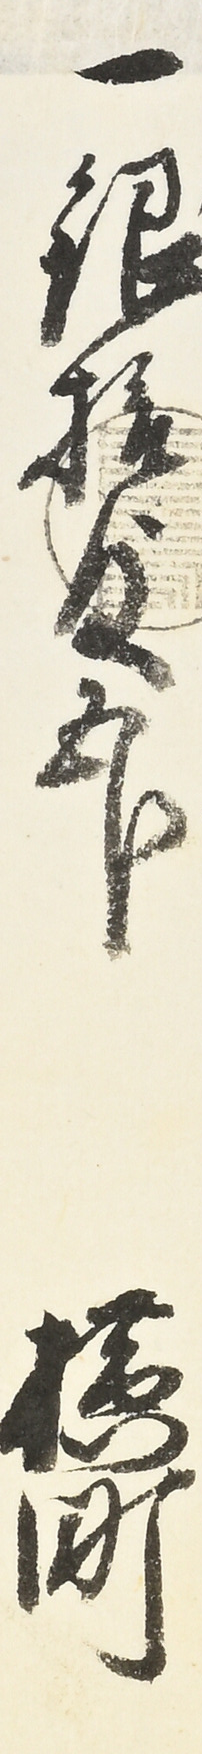一銀拾匁五分横町
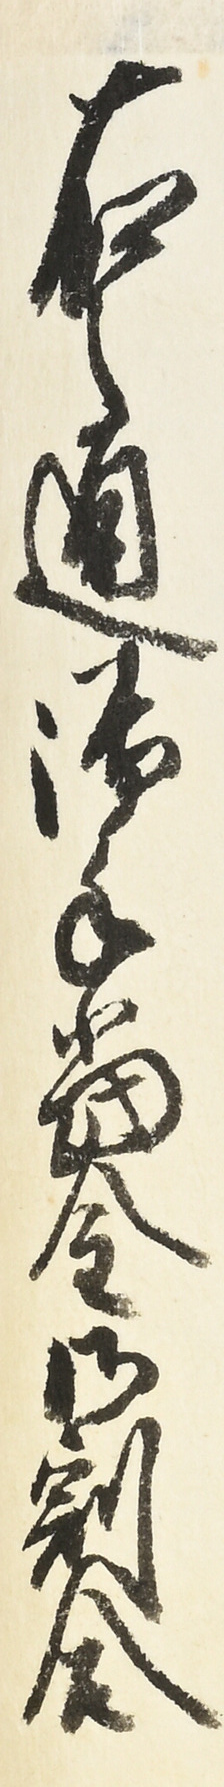右之通御手当金御割合
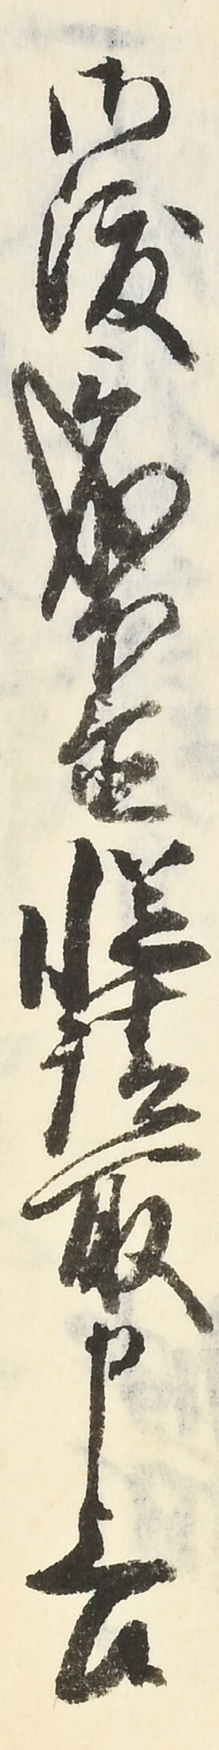御渡被成下置慥請取申上候
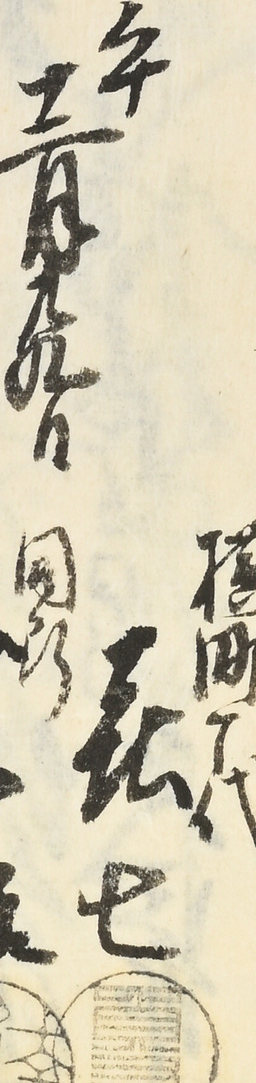十二月廿九日同断
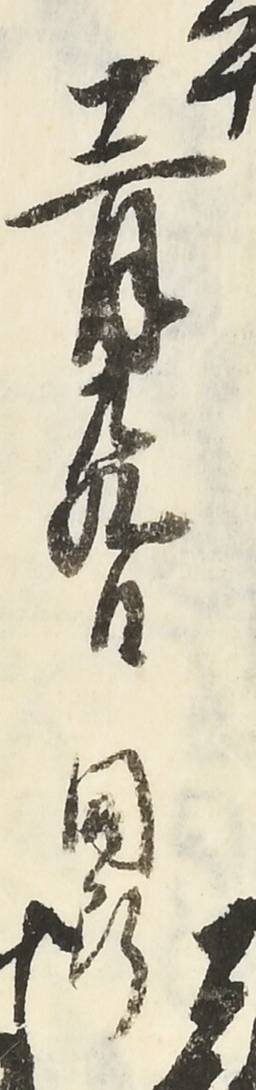十二月廿九日同断

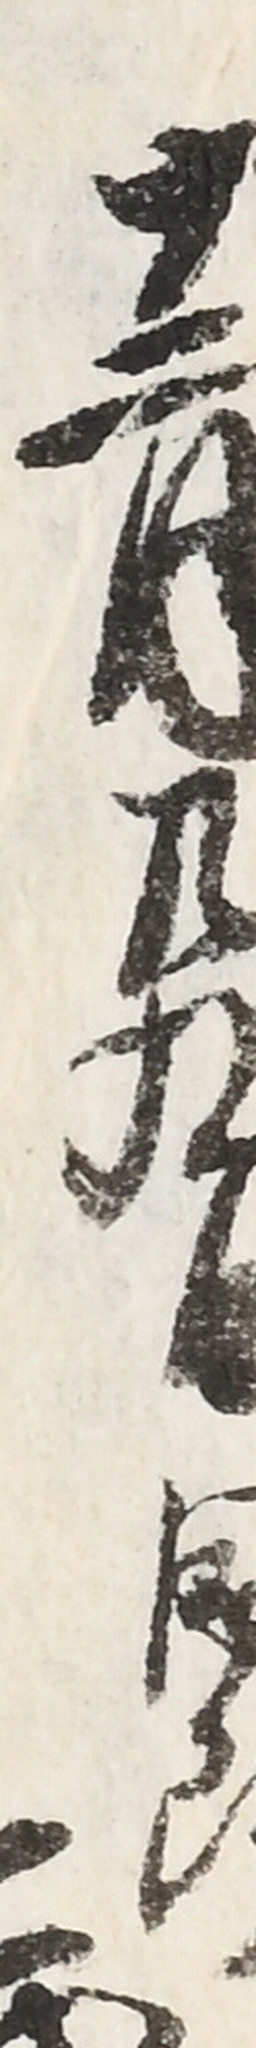十二月廿九日同断
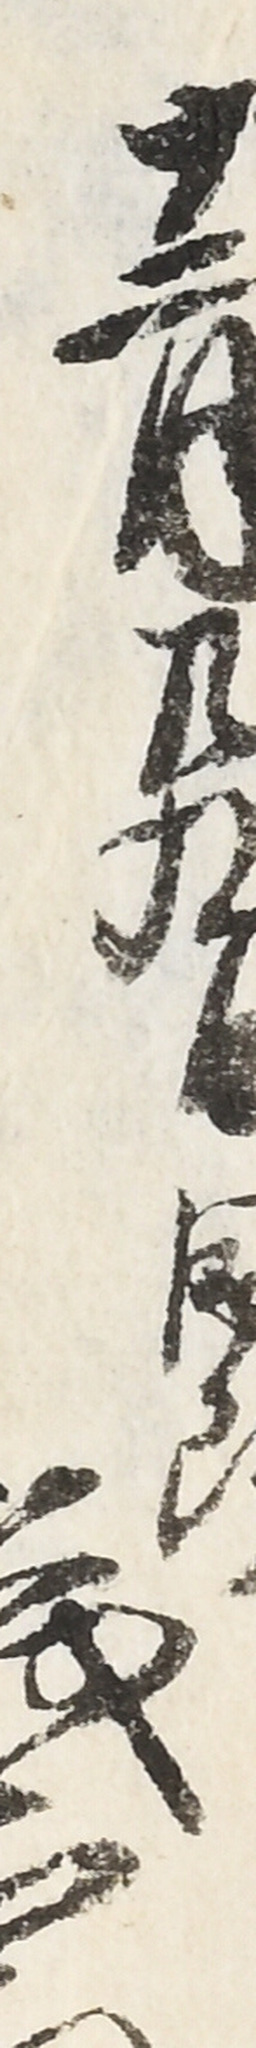十二月廿九日同断
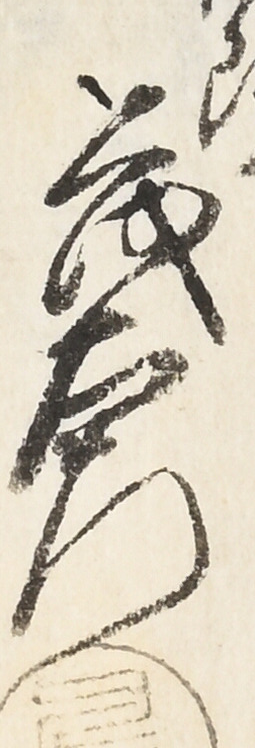伝右衛門
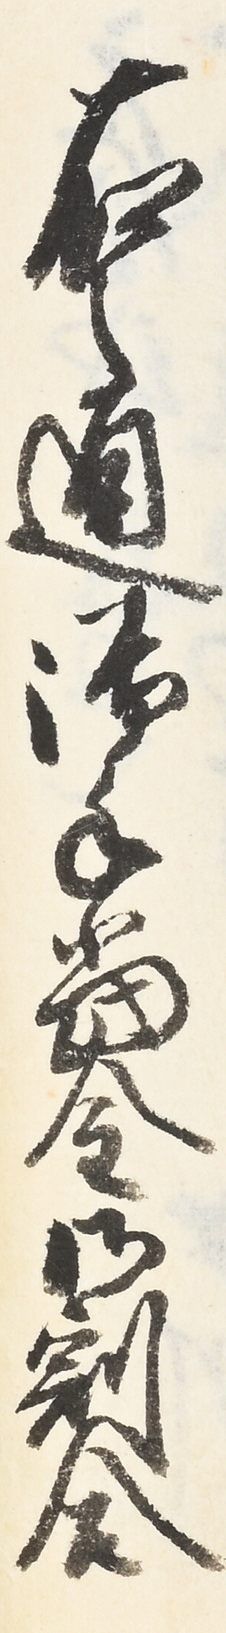右之通御手当金御割合
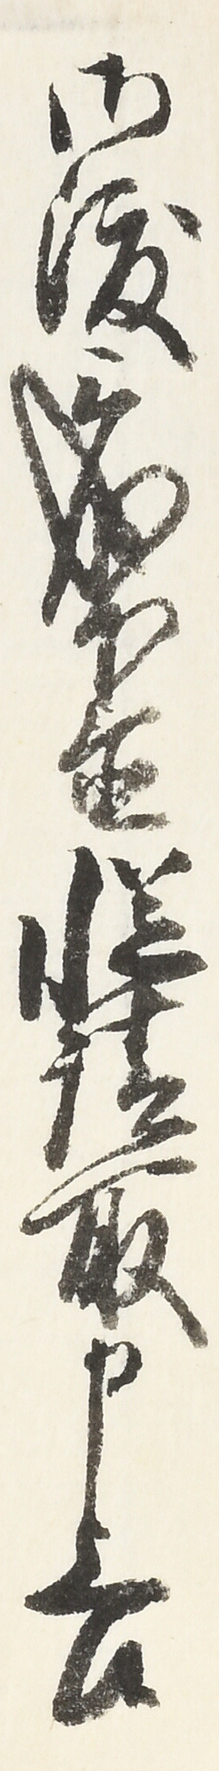御渡被成下置慥請取申上候
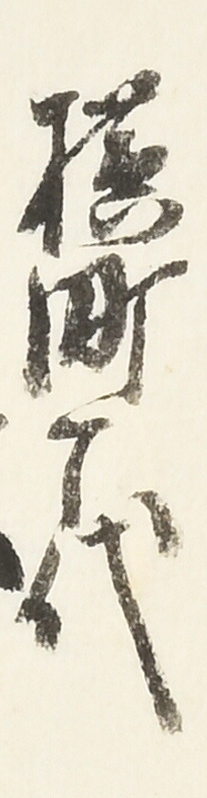横町丁代
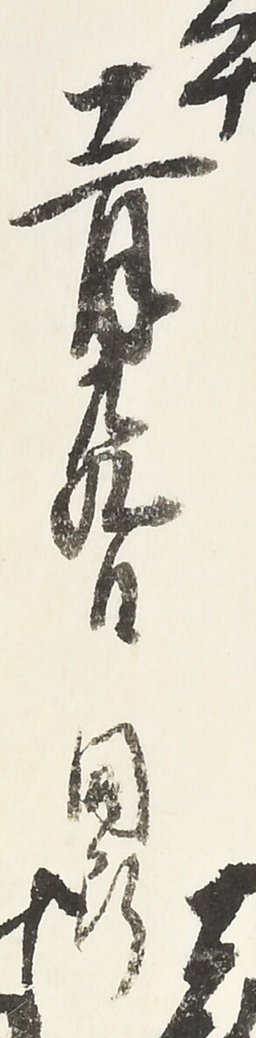十二月廿九日同断
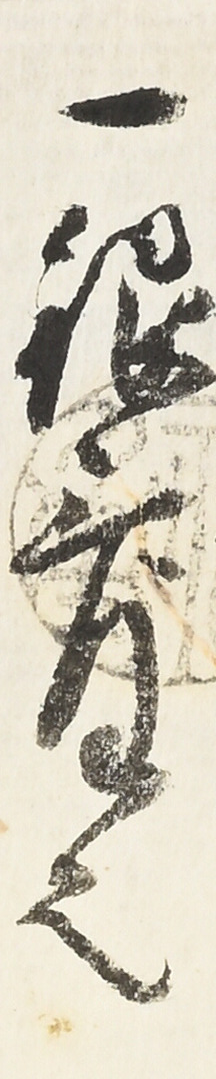一銀三匁也
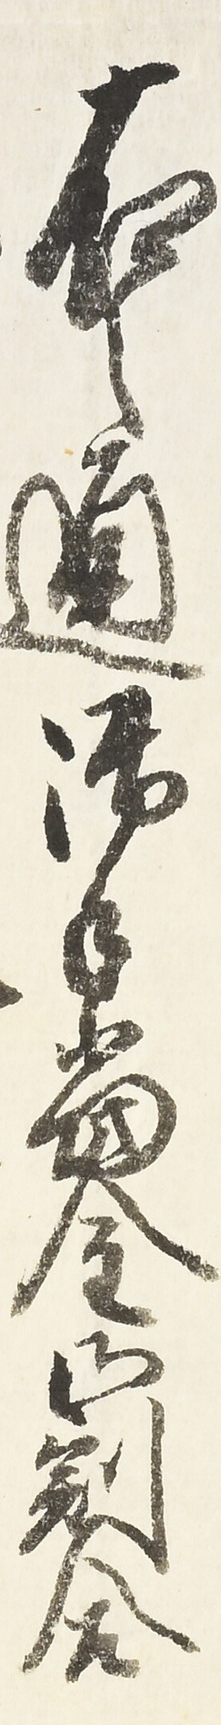右之通御手当金御割合
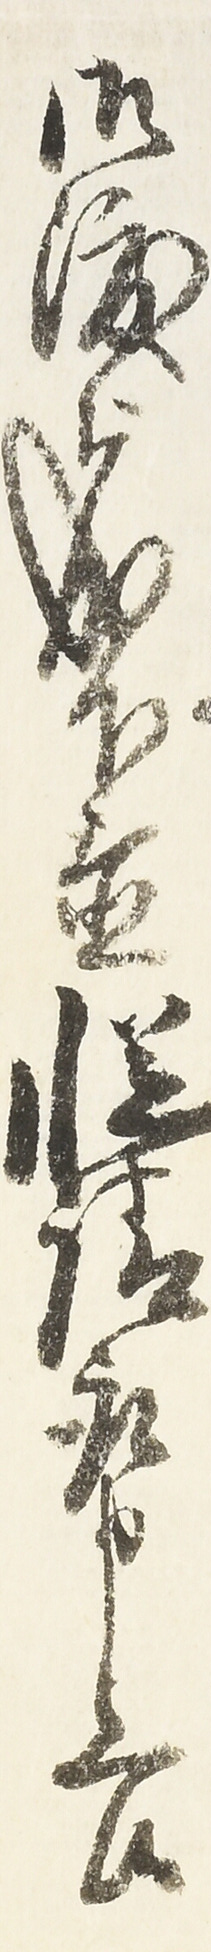御渡被成下置慥請取申上候
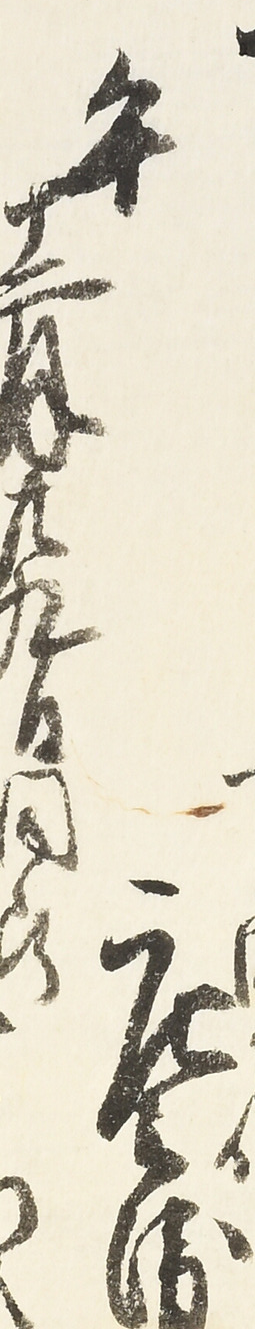十二月廿九日同断
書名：御才覚金御利足割渡扣帳
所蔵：伊那市立高遠町図書館・合同会社AMANE
